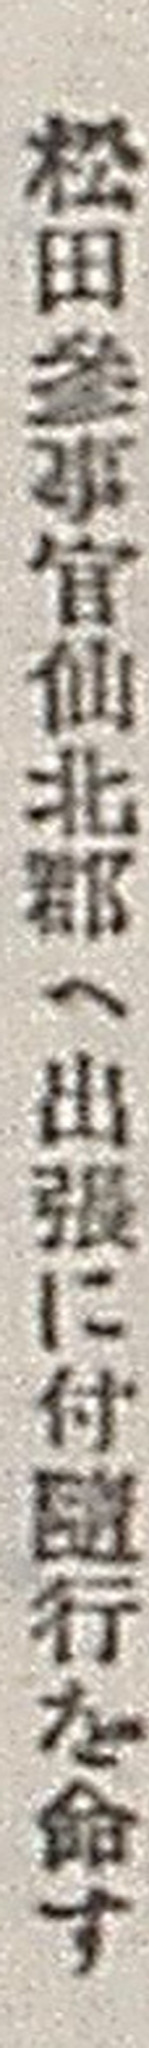松田参事官仙北郡へ出張に付随行を命す
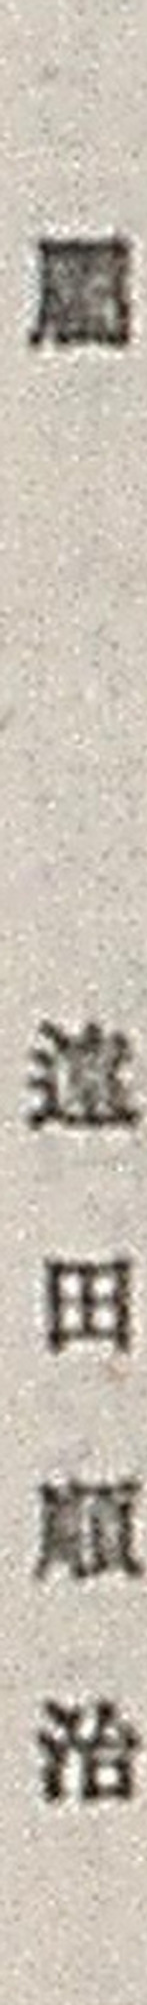属遠田順治
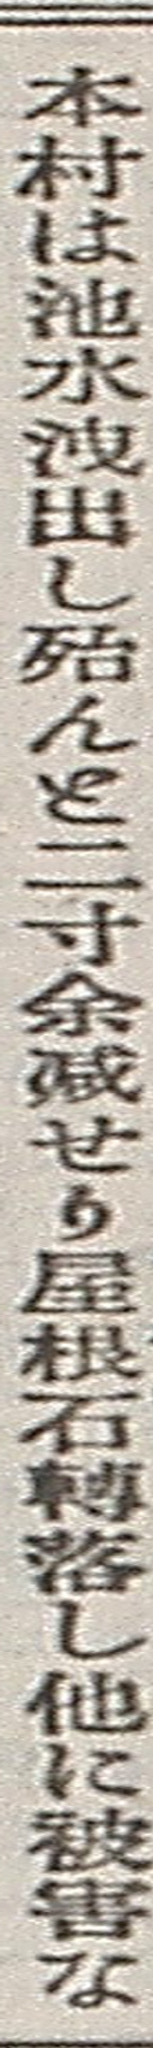本村は池水洩出し殆んと二寸余減せり屋根石転落し他に被害な
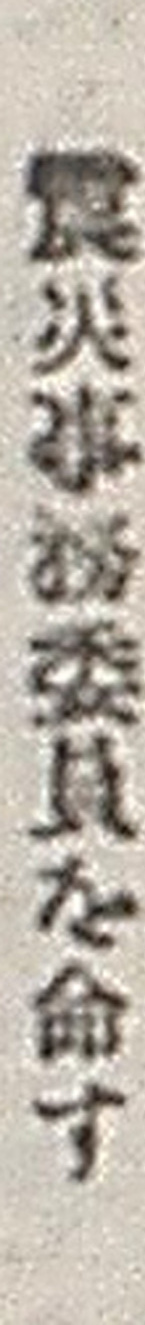震災事務委員を命す
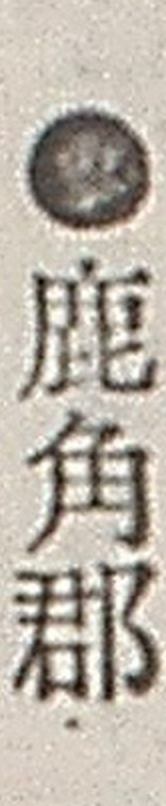●鹿角郡
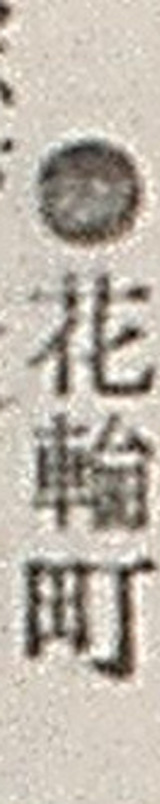●花輪町
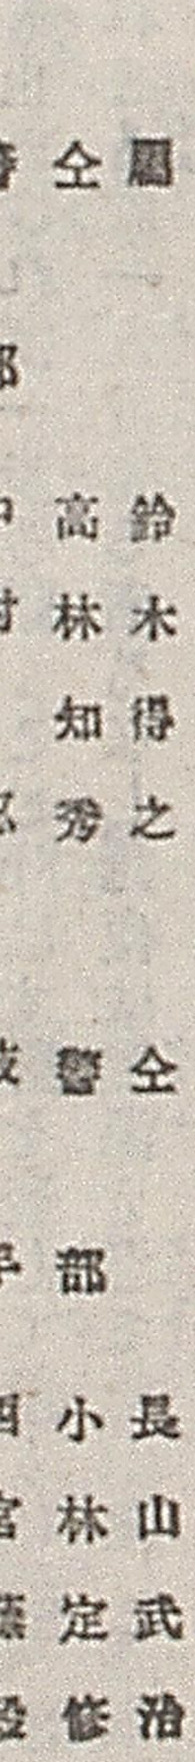仝高林知秀警部小林定修
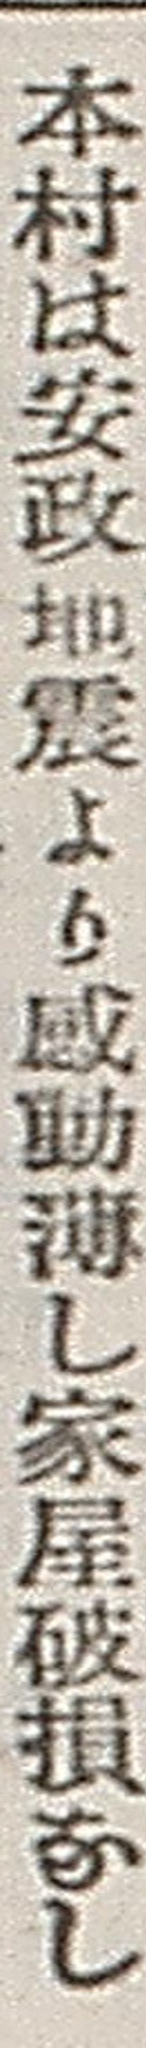本村は安政地震より感動薄し家屋破損なし
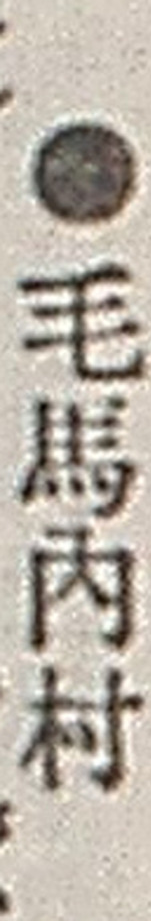●毛馬内村
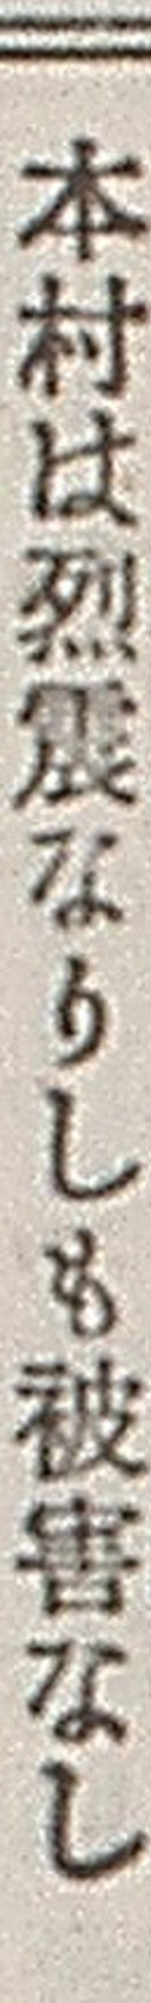本村は烈震なりしも被害なし
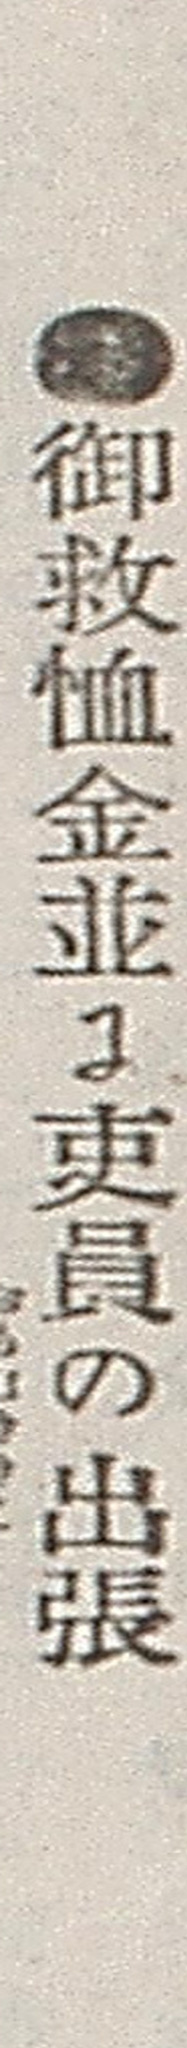●御救恤金並に吏員の出張
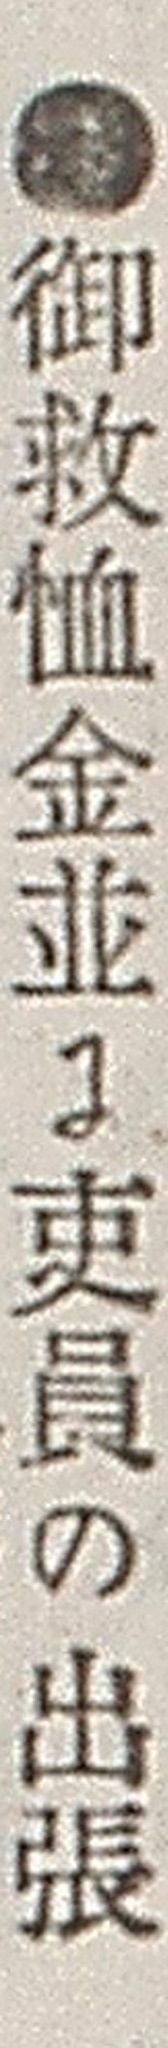●御救恤金並に吏員の出張
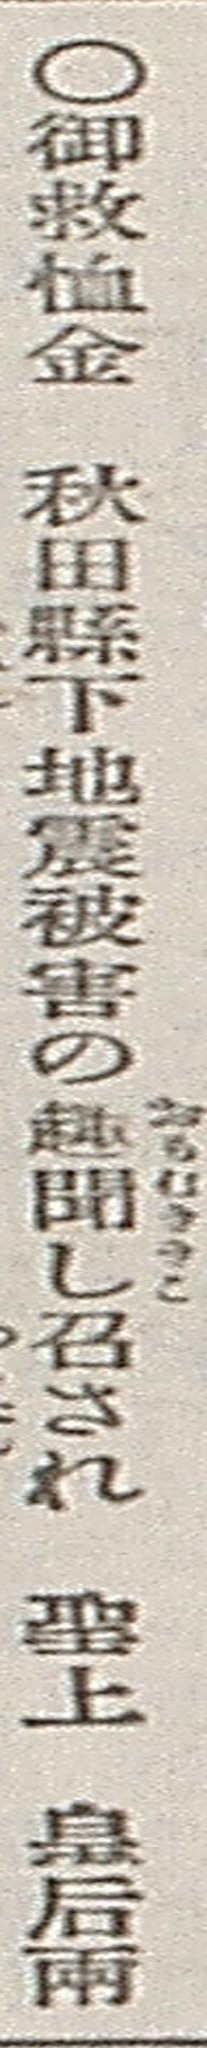〇御救恤金秋田県下地震被害の趣聞し召され聖上皇后両
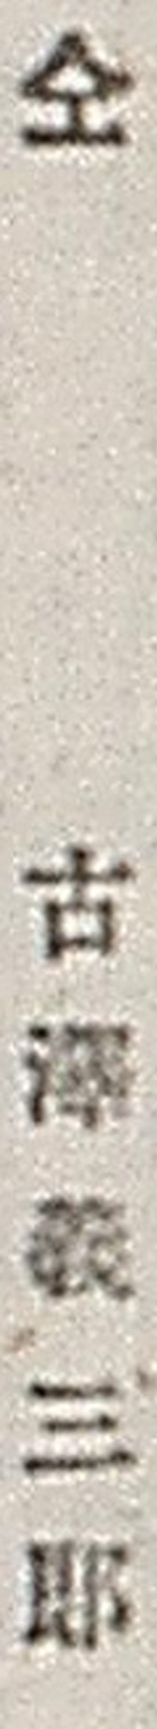仝古澤義三郎
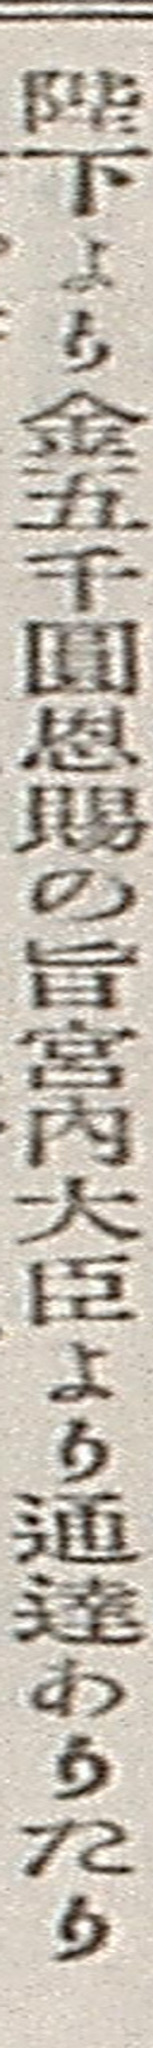陛下より金五千円恩賜の旨宮内大臣より通達ありたり
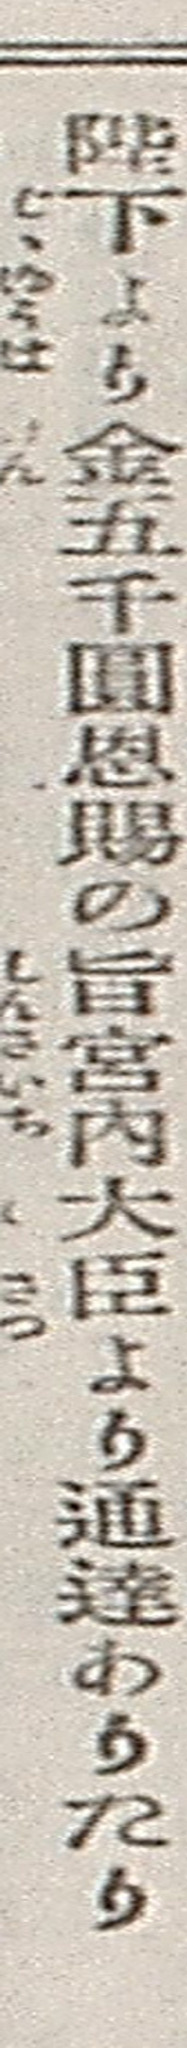陛下より金五千円恩賜の旨宮内大臣より通達ありたり
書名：風俗畫報臨時増刊第百二十四號　洪水地震被害録（上）
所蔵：東京大学地震研究所図書室 Earthquake Research Institute Library, The University of Tokyo, JAPAN
